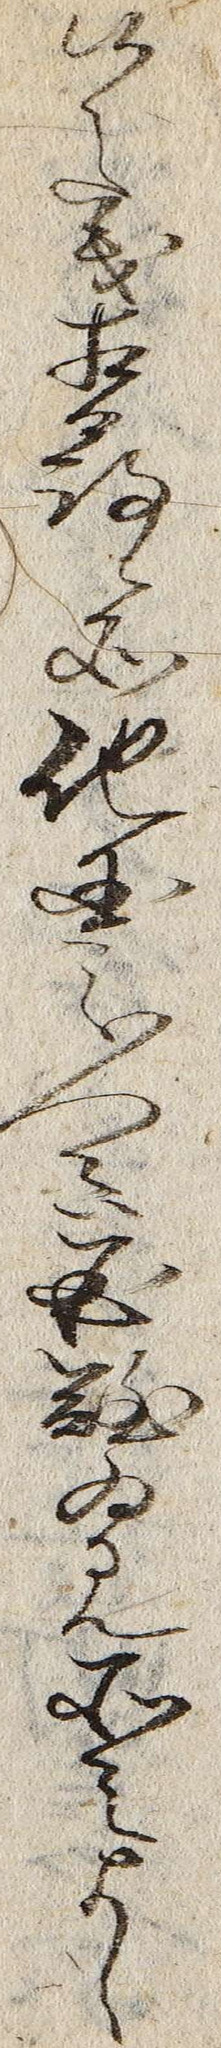候の義相尋候所他国の人々は必難為見所のよし
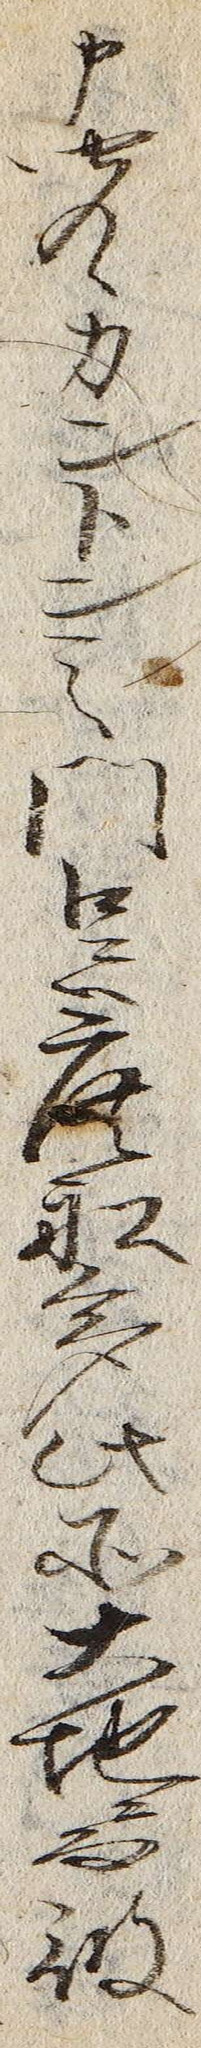申聞候カントンの門口には唐船多此所大地にて彼
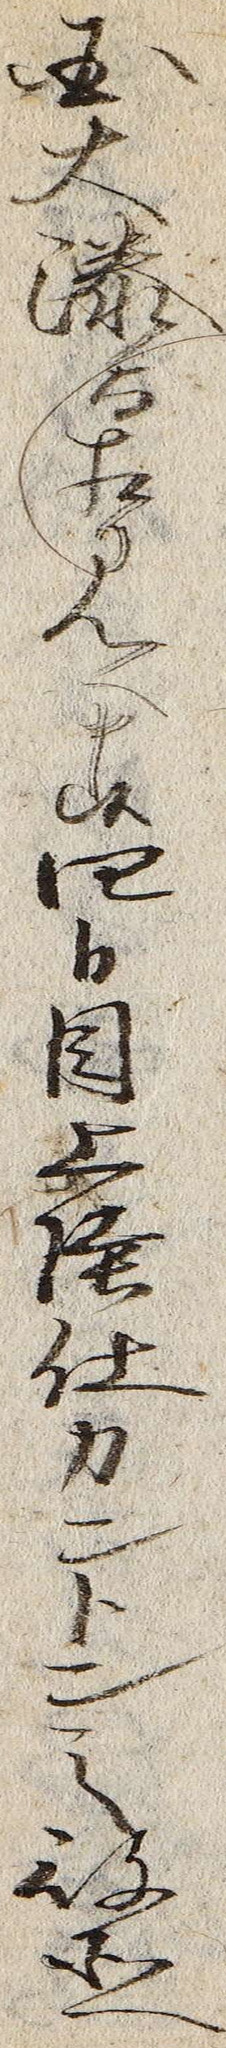国大湊と相見へ申候四日目上陸仕カントンの役所へ
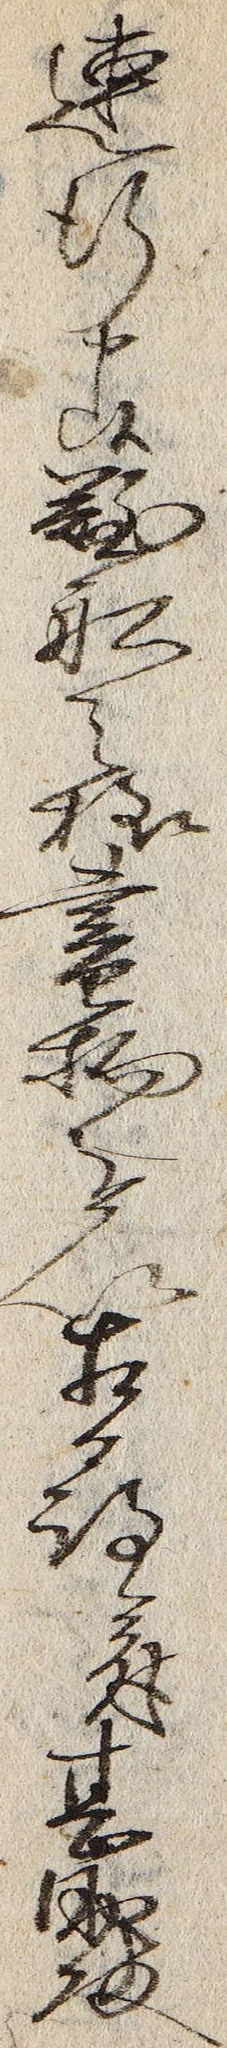連行申候難船の様書物を以相尋候に付甚助殿
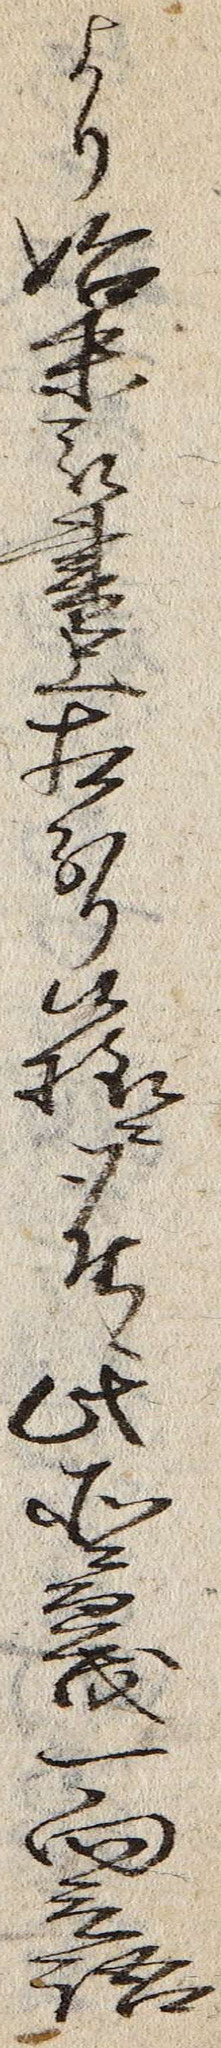より始末被書上相分り候様に御座候此所にても一向言語
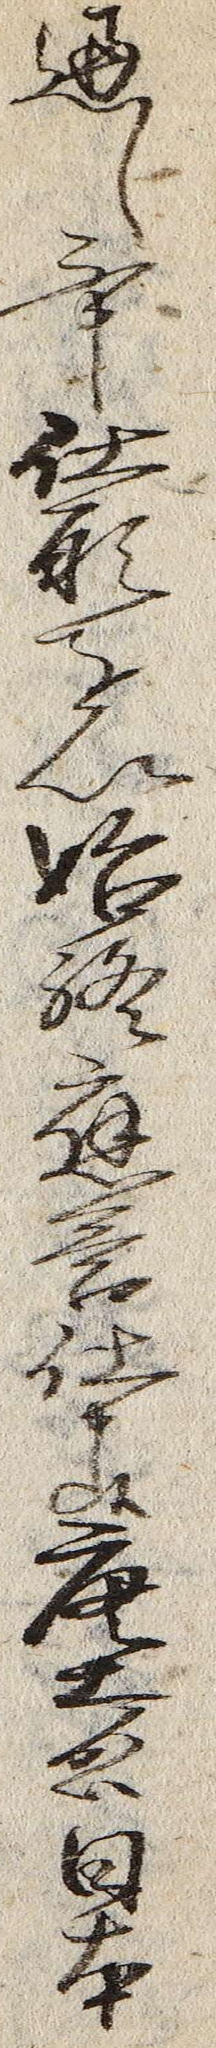通し不申仕形を以始終応答仕申候唐土よりは日本
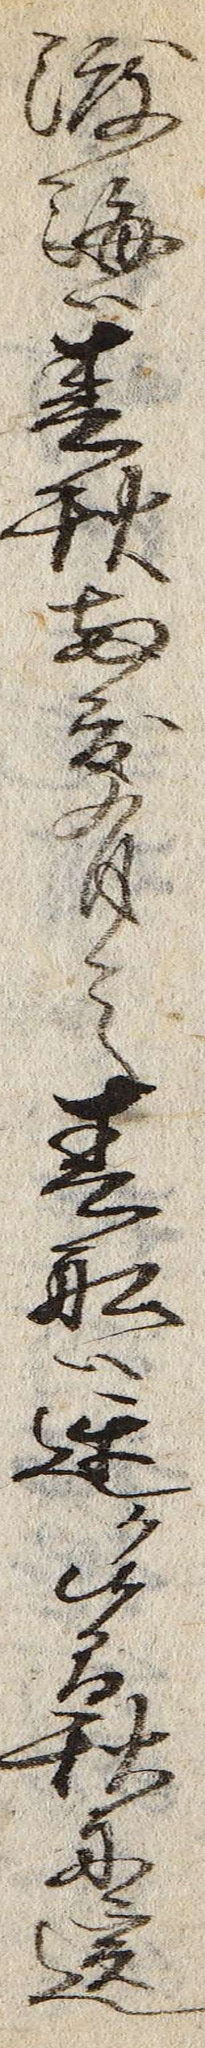渡海は春秋両度有之春船は遅く候間秋舟に送
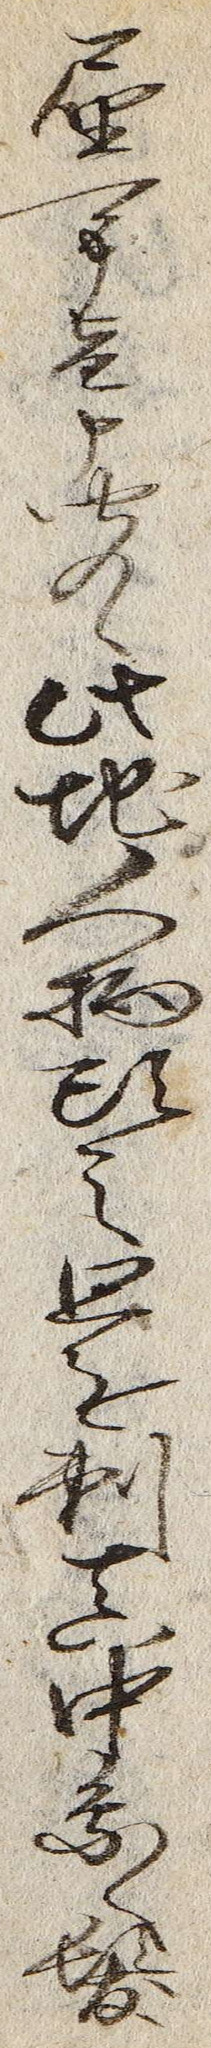届可申旨申聞候此地人物頭の廻りを刺真中参候髪
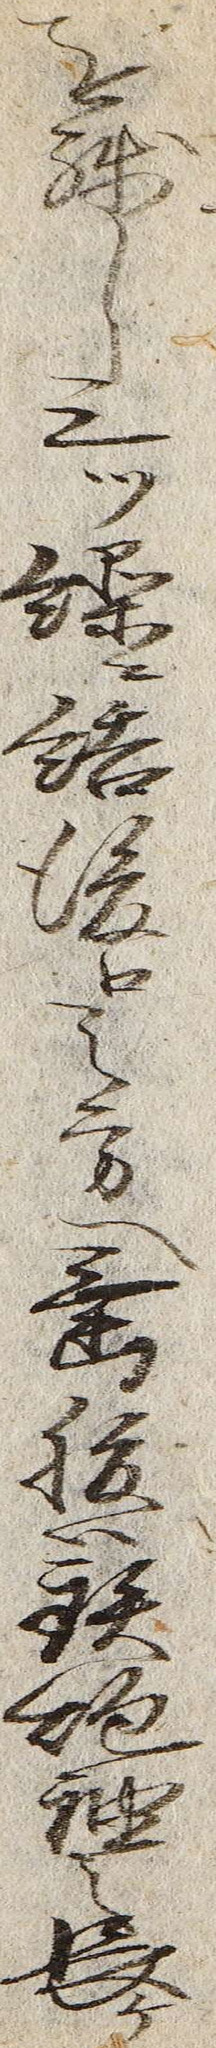を残し三つ繰に結後ロの方へ垂腹は鉄砲袖の長ケ
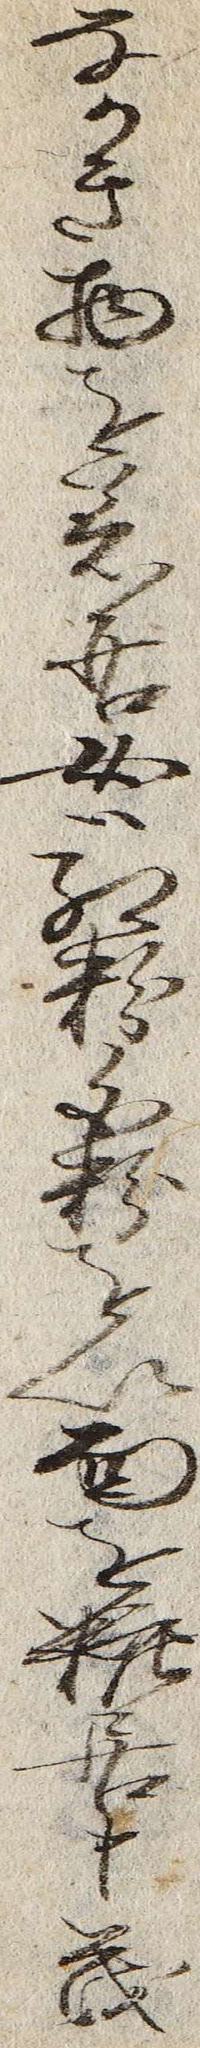なかき物を着居女は紅粉白粉以面を粧居申も
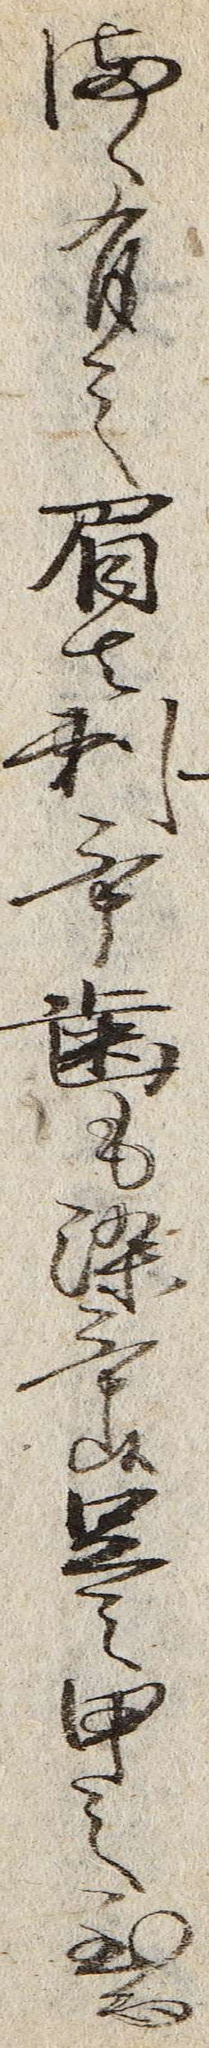まゝ有之眉は刺不申歯も染不申足の甲の至て
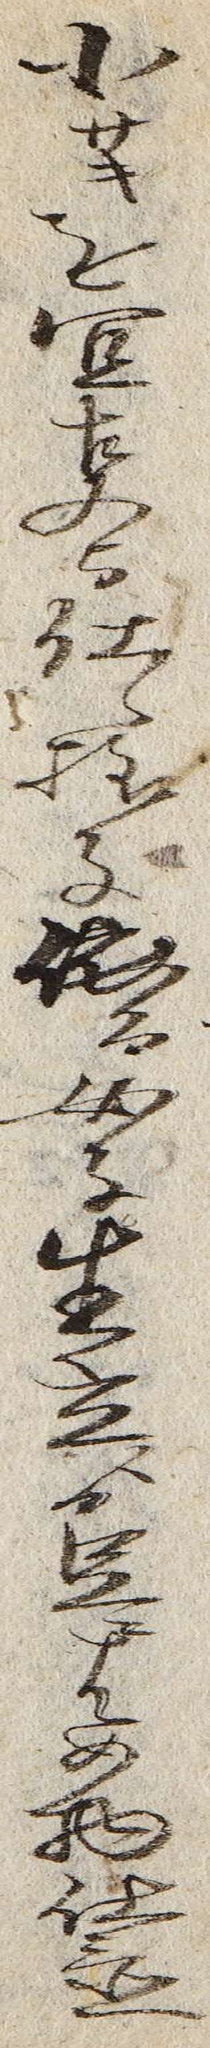小さきを宜事と仕候様子依て女子生立より足にはめ物仕置
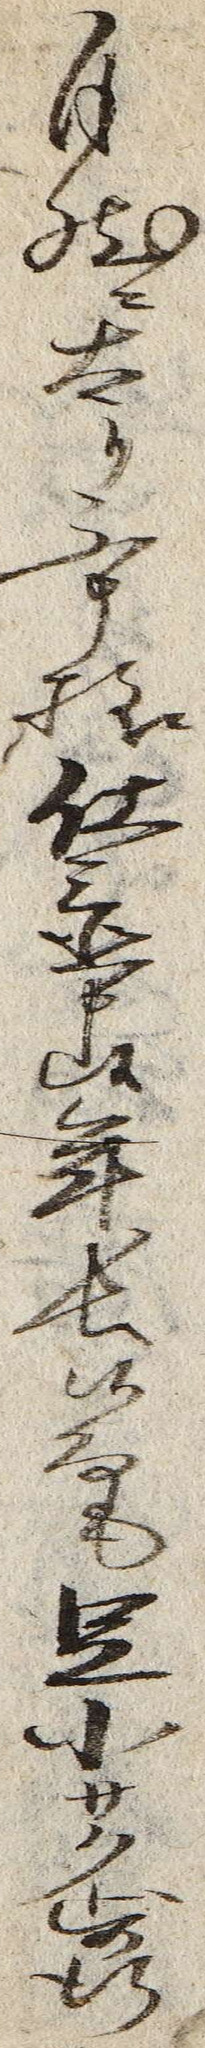自然に太り不申様仕置申候年長候ても足小さく歩行
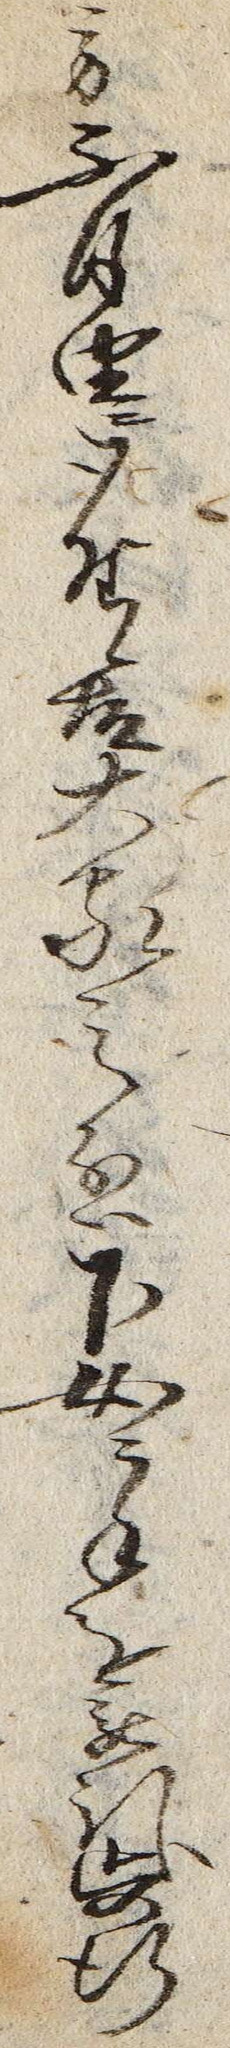方不自由に御座候故大家の分は下女に手を被引歩行
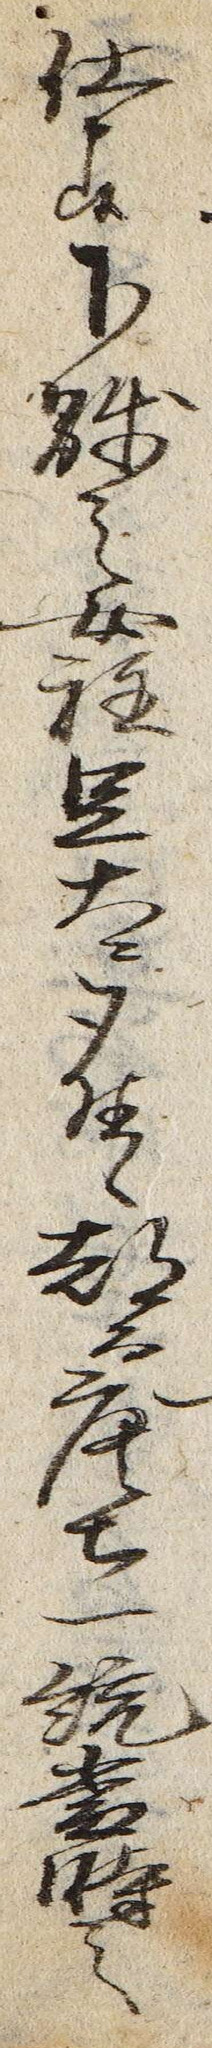仕申候下賤の女程足大に御座候都て唐土一統当時の

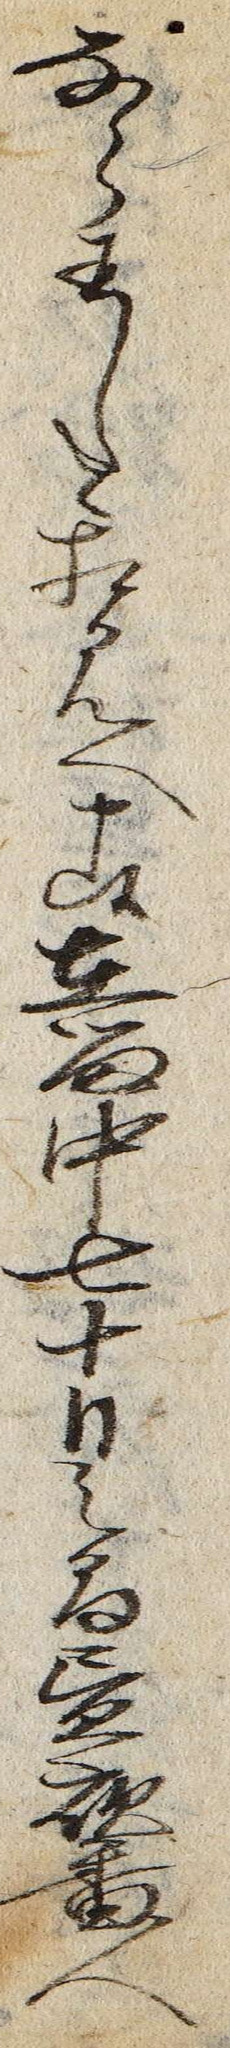ならわしと相見へ申候在留中七十日の間昼夜番人
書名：能登国清兵衛異国江漂流之始末
